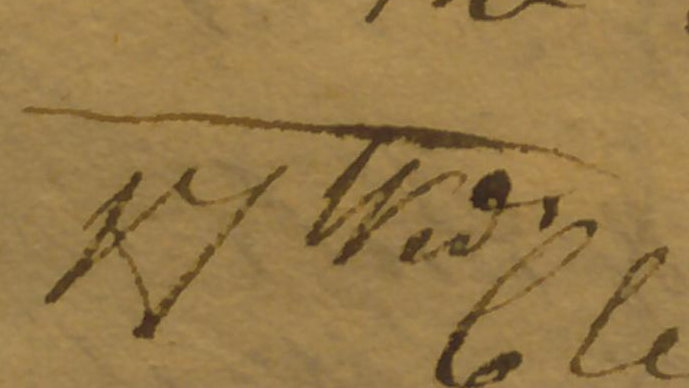17 Wed
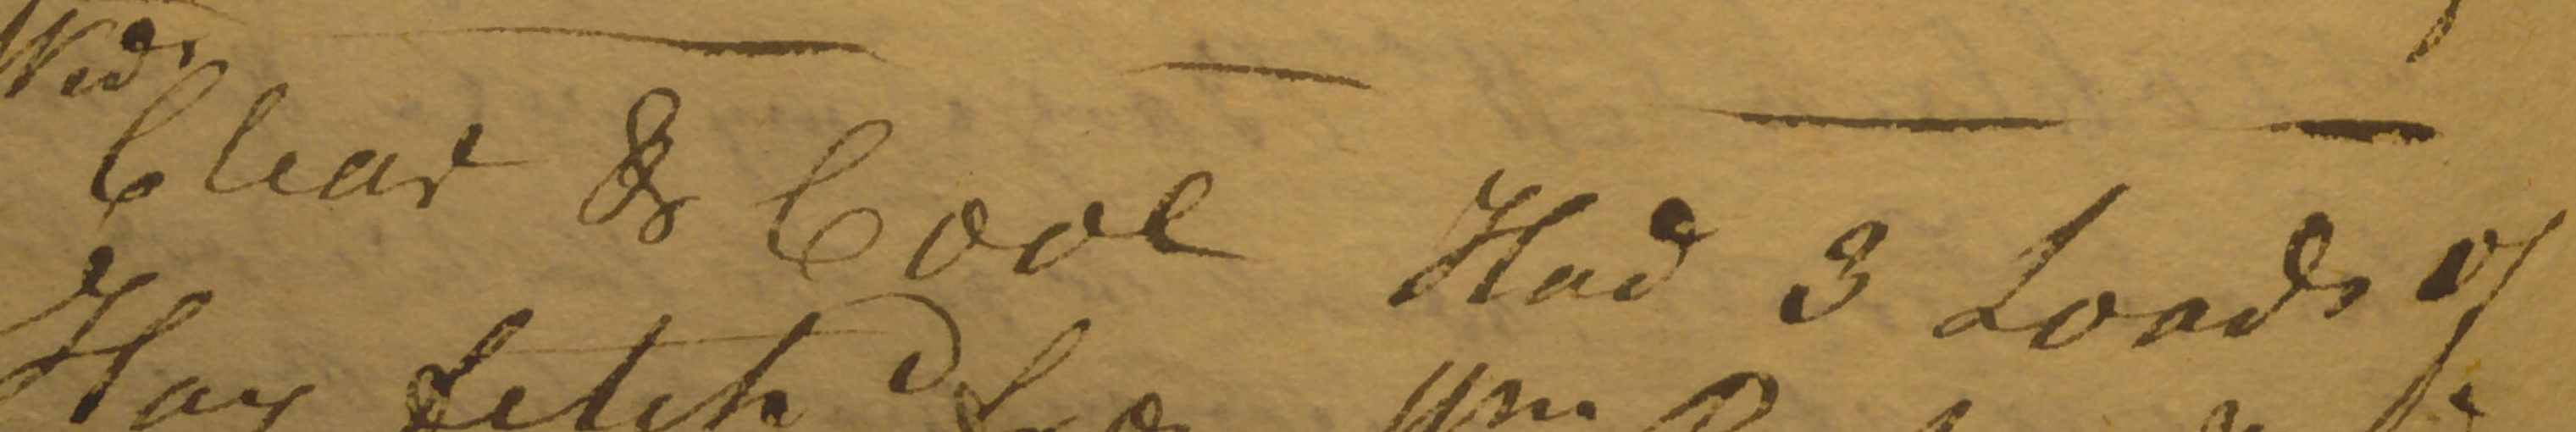Clear & Cool Had 3 Loads of
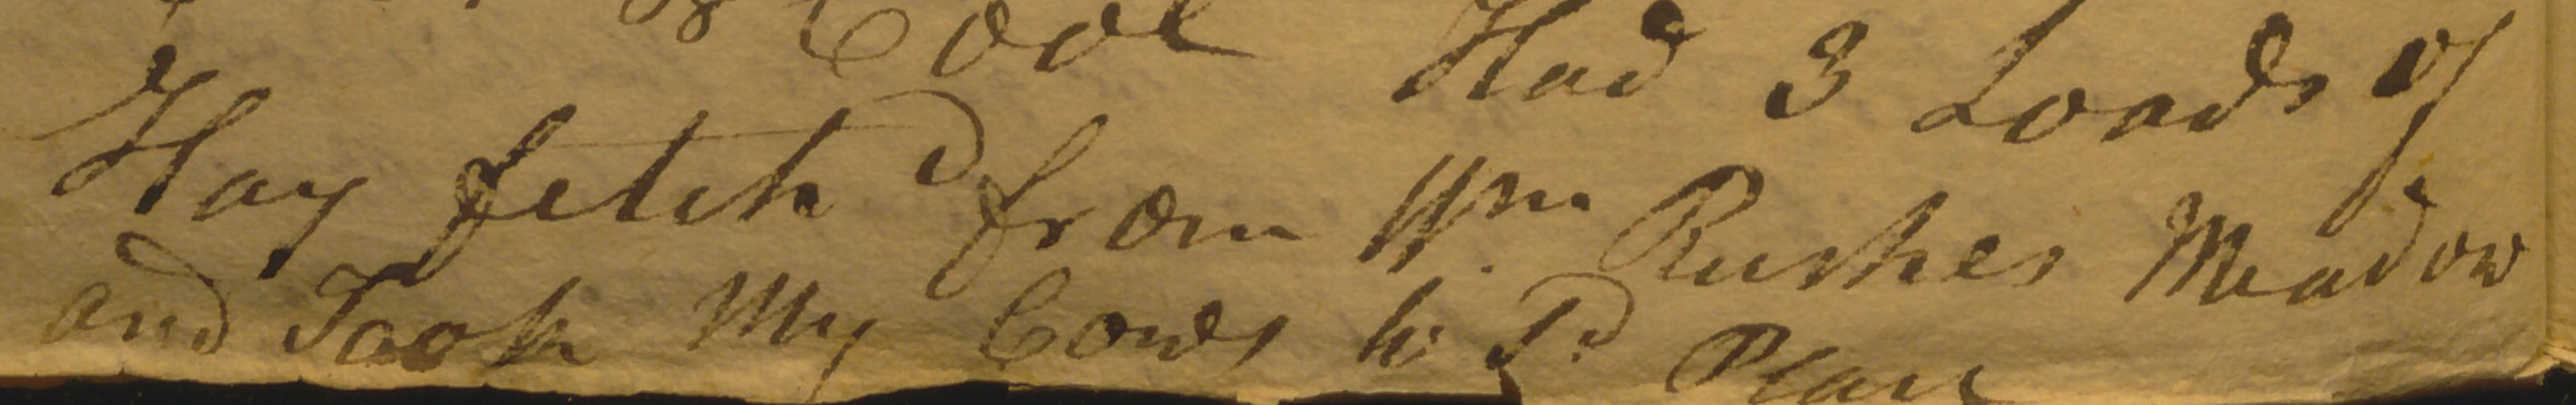Hay fetch^d from W^m. Rushes Meadow
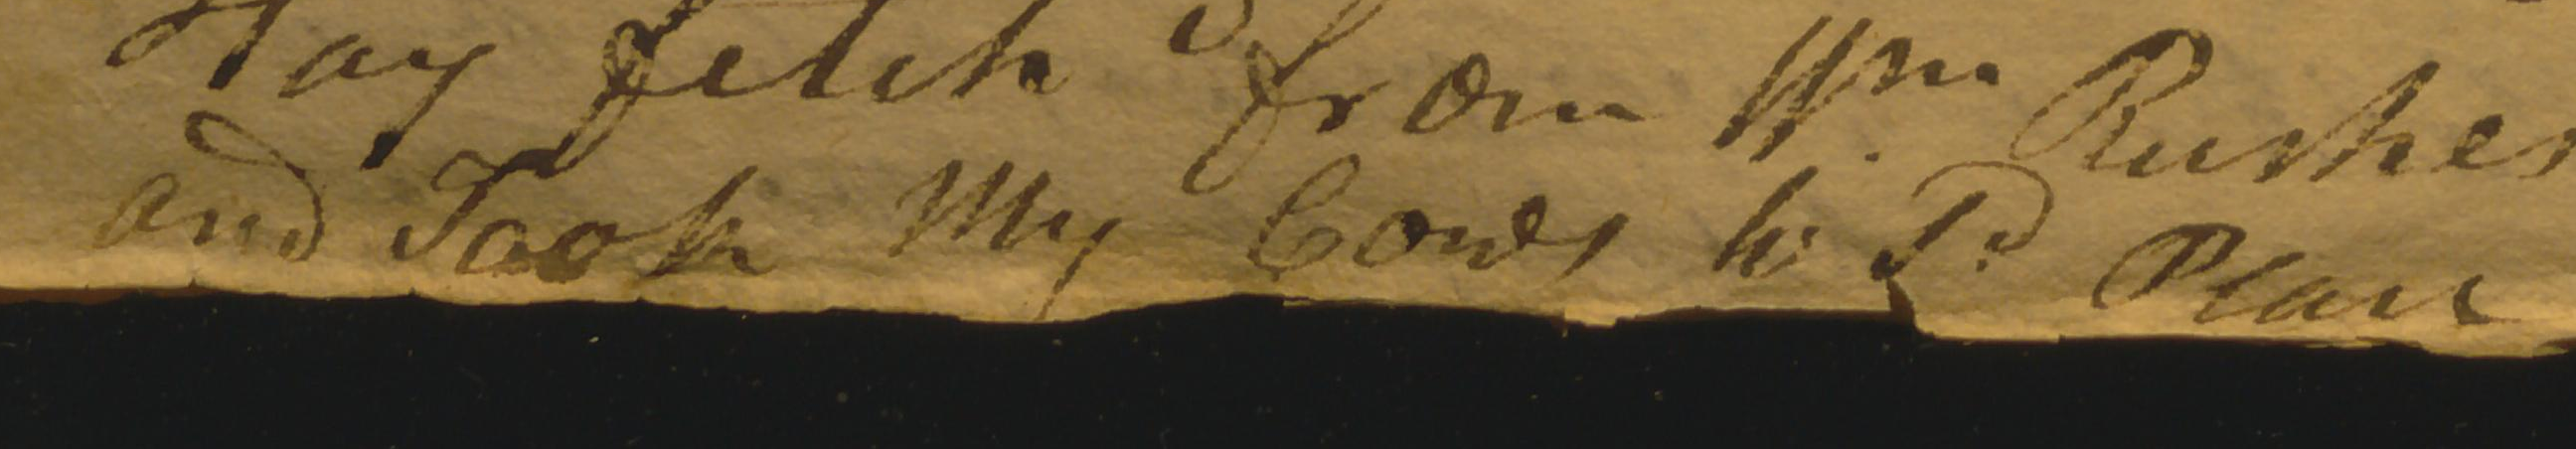and Took My Cows to s^d. Place
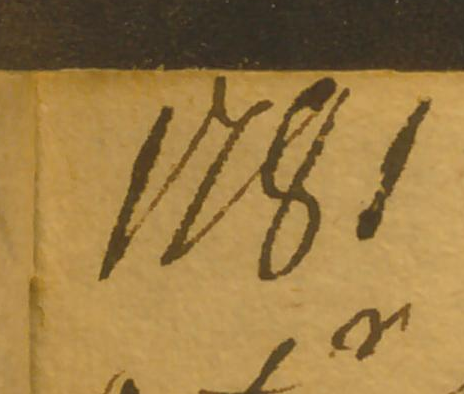1781
